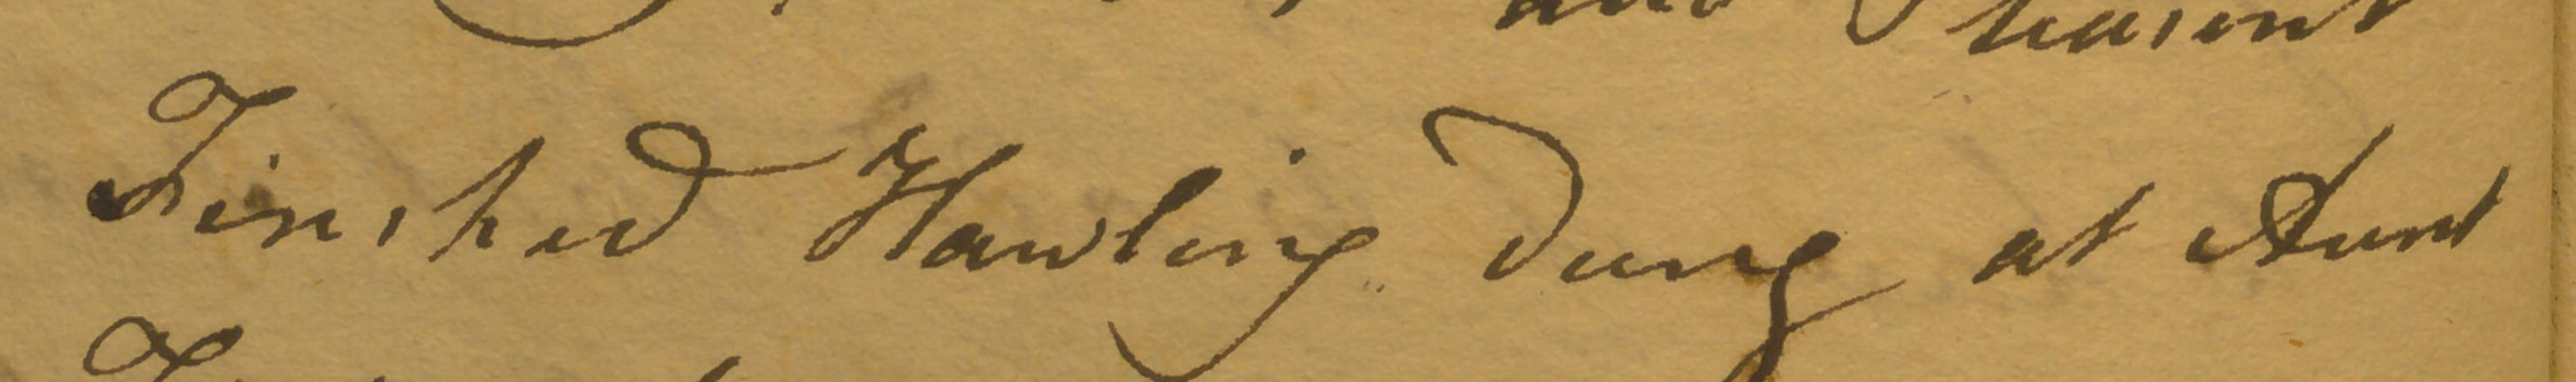Finshed Hawling dung at Aunt
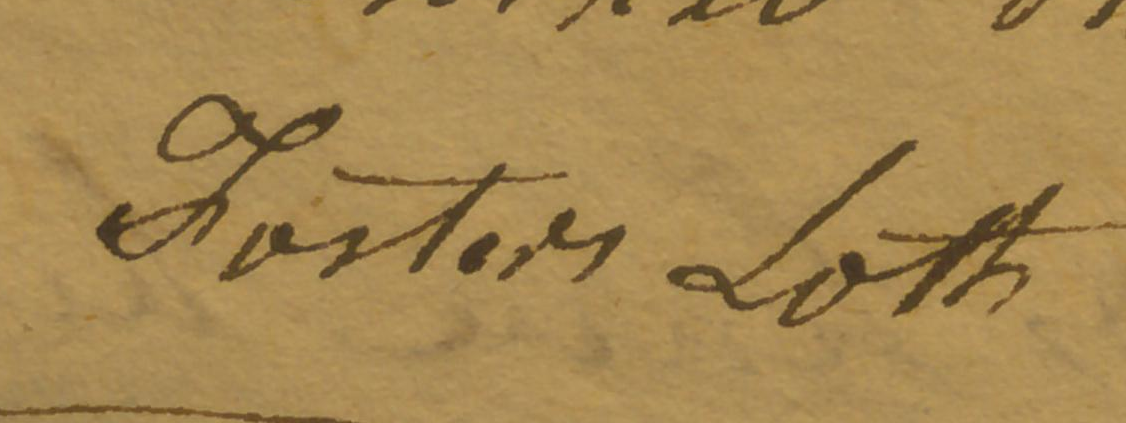Fosters Lott
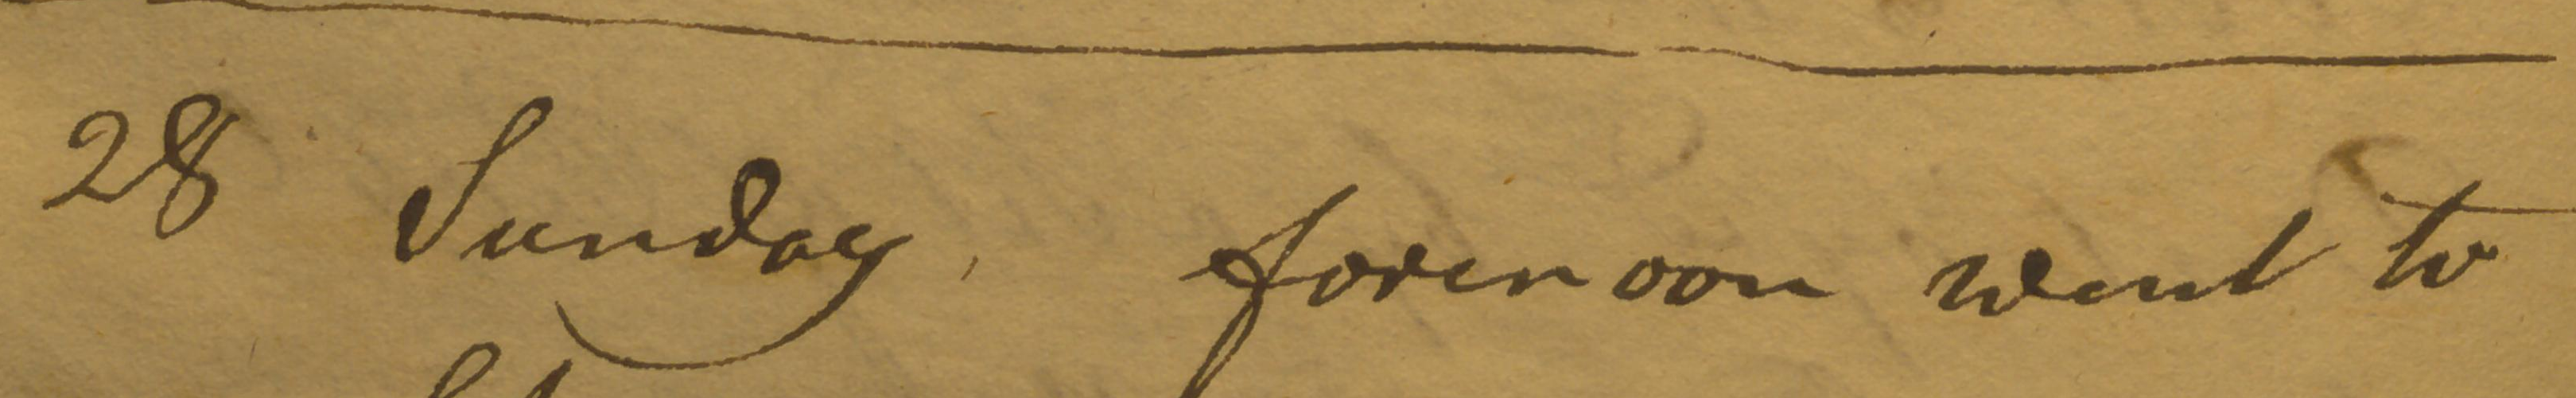28 Sunday, forenoon went to
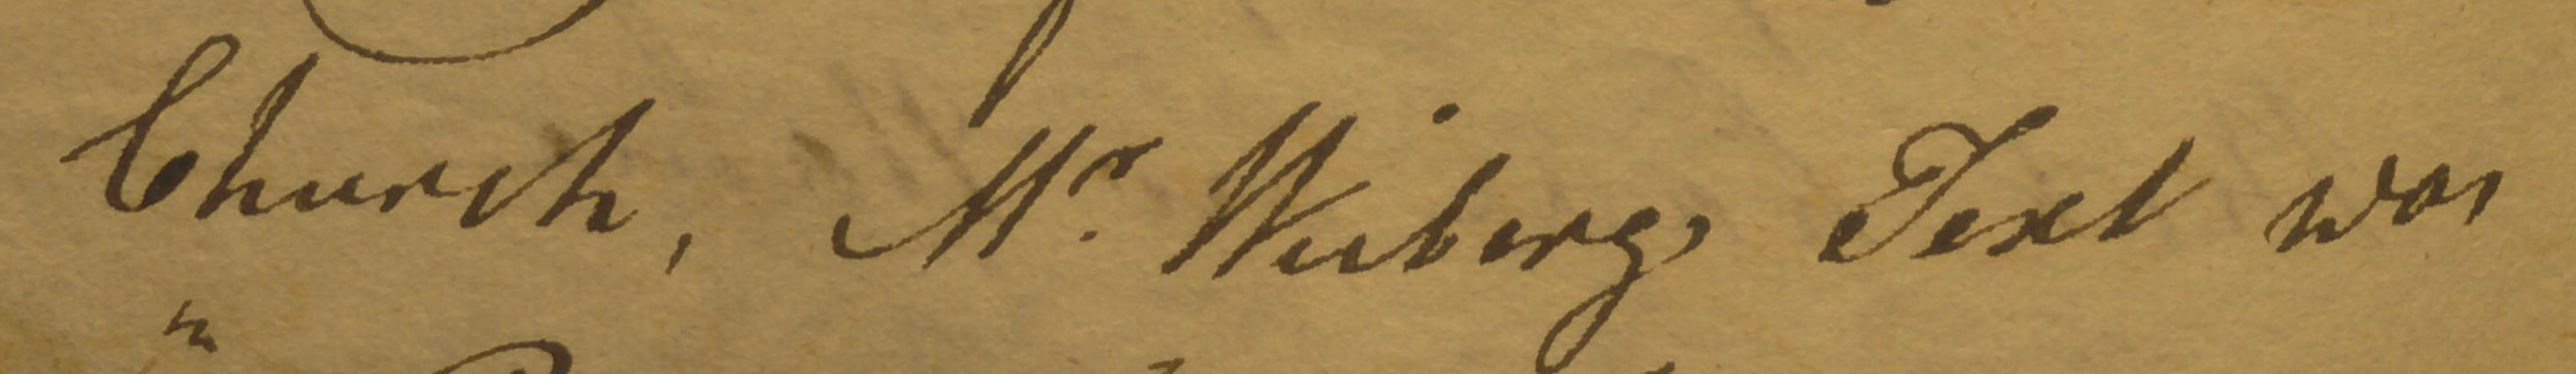Church, M^r. Weiberg Text was
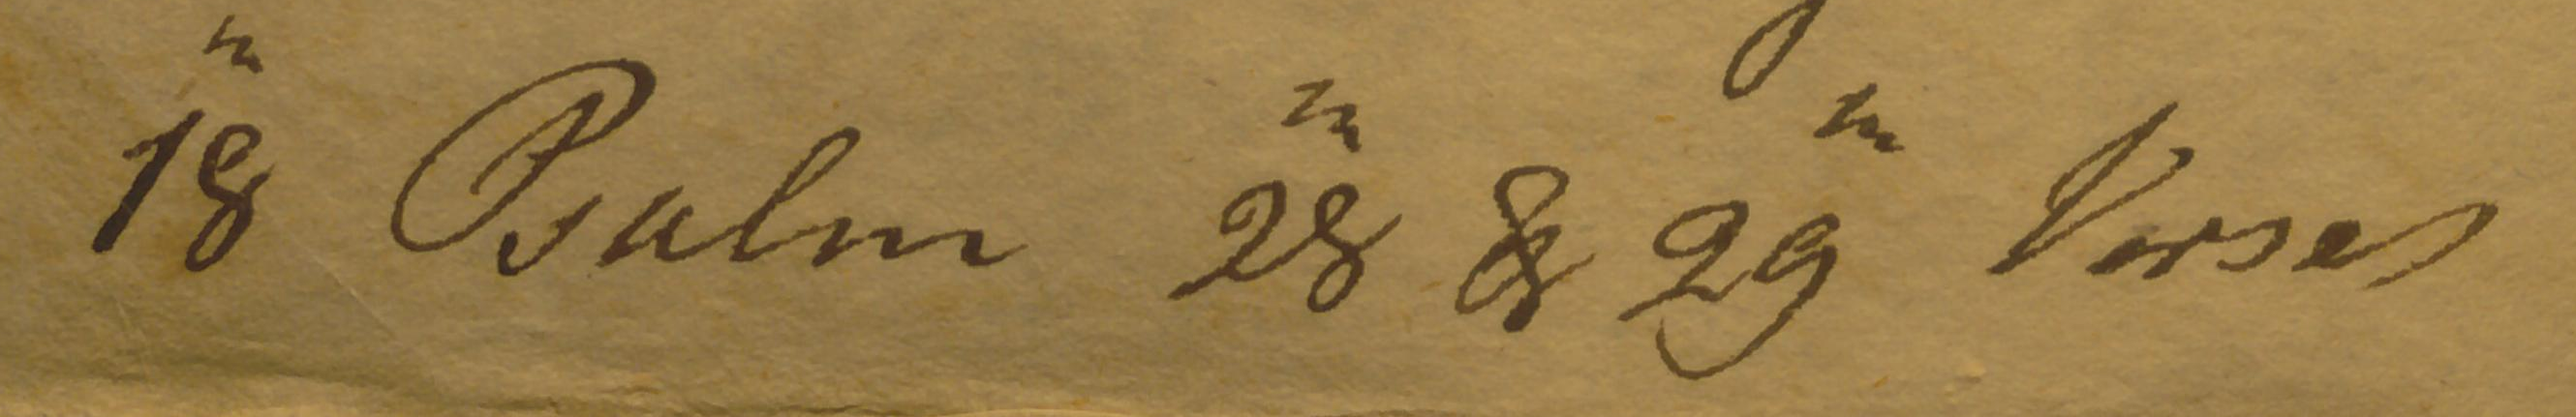18^th Psalm 28^th & 29^th Verses
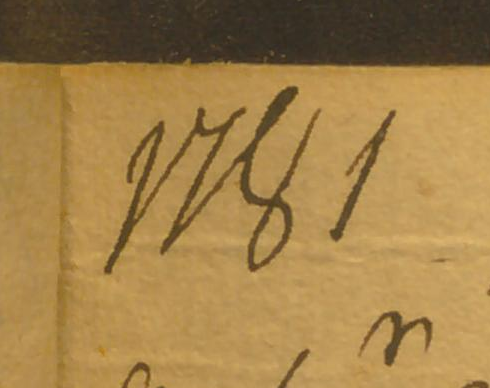1781
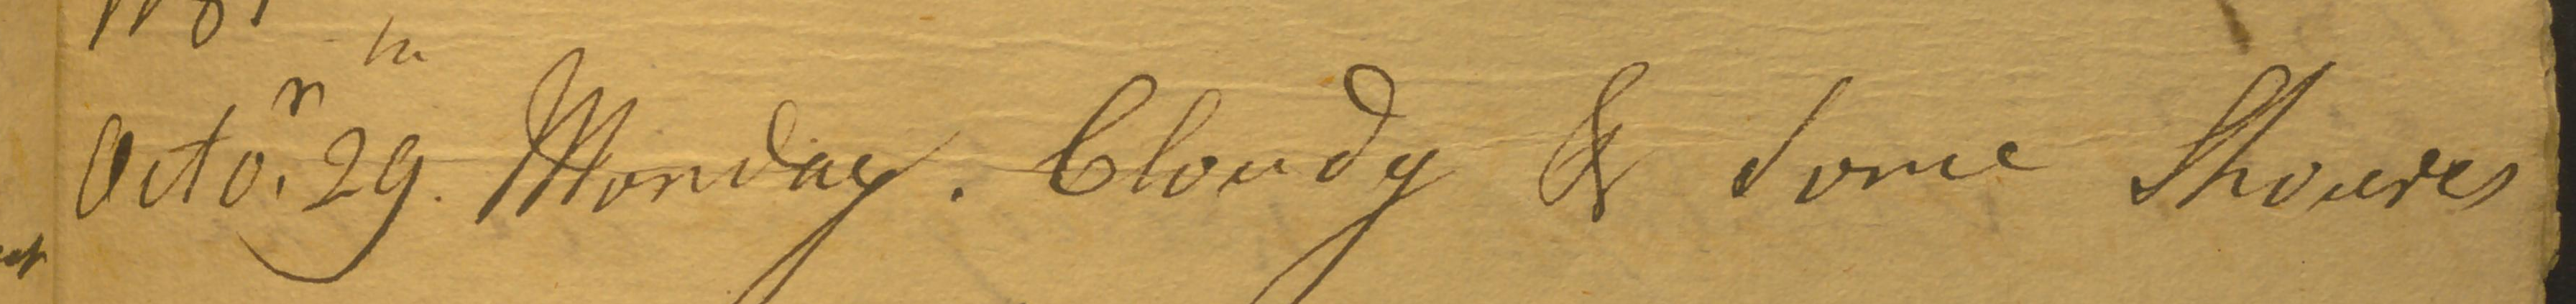Octo^r. 29^th. Monday. Cloudy & some Shoures
